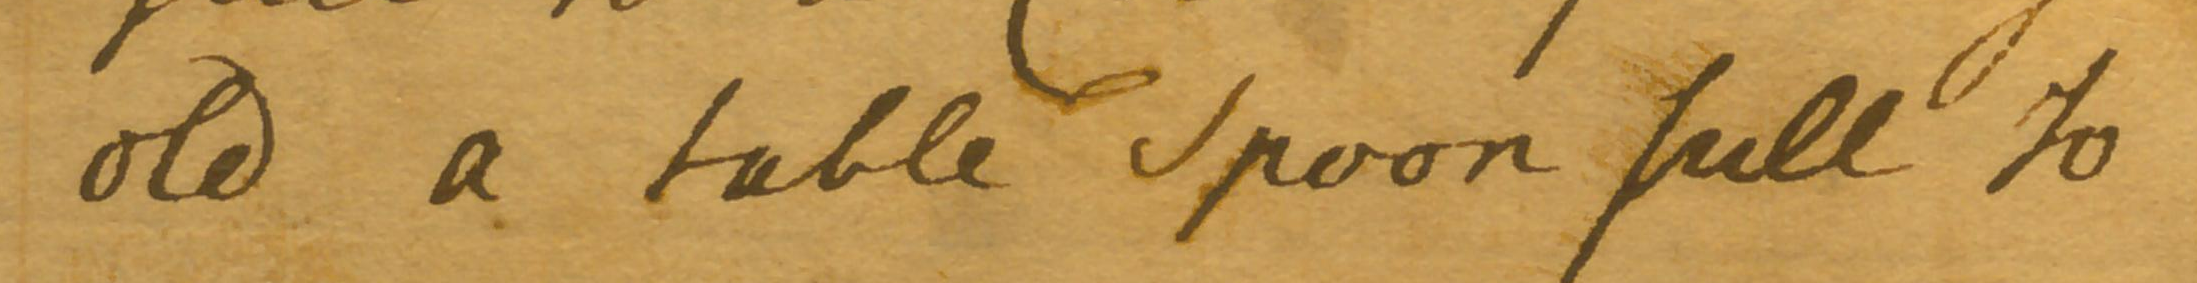old a table spoon full to
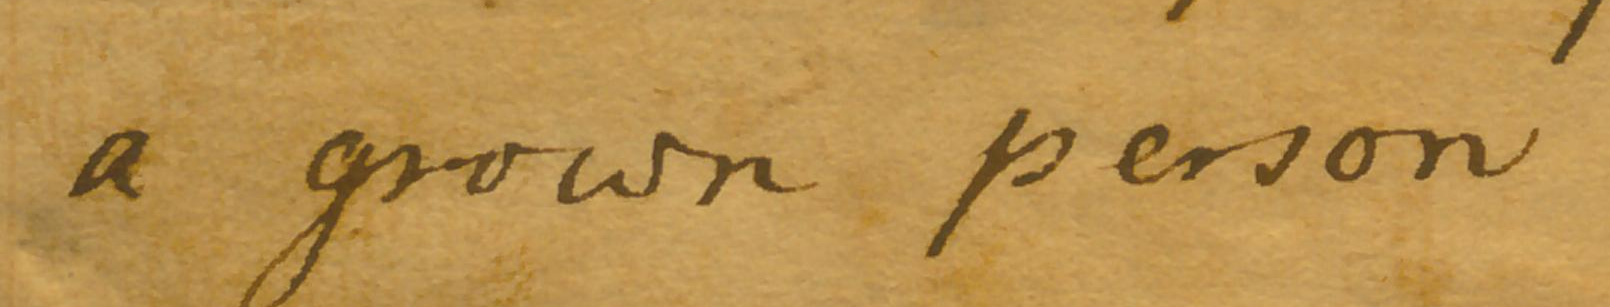a grown person
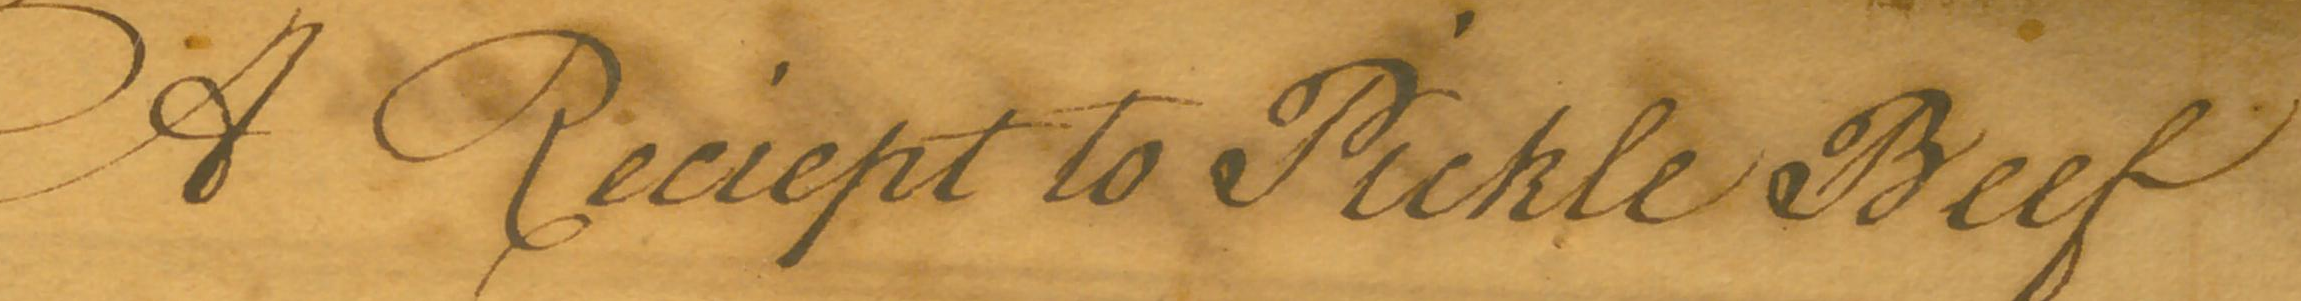A Reciept to Pickle Beef
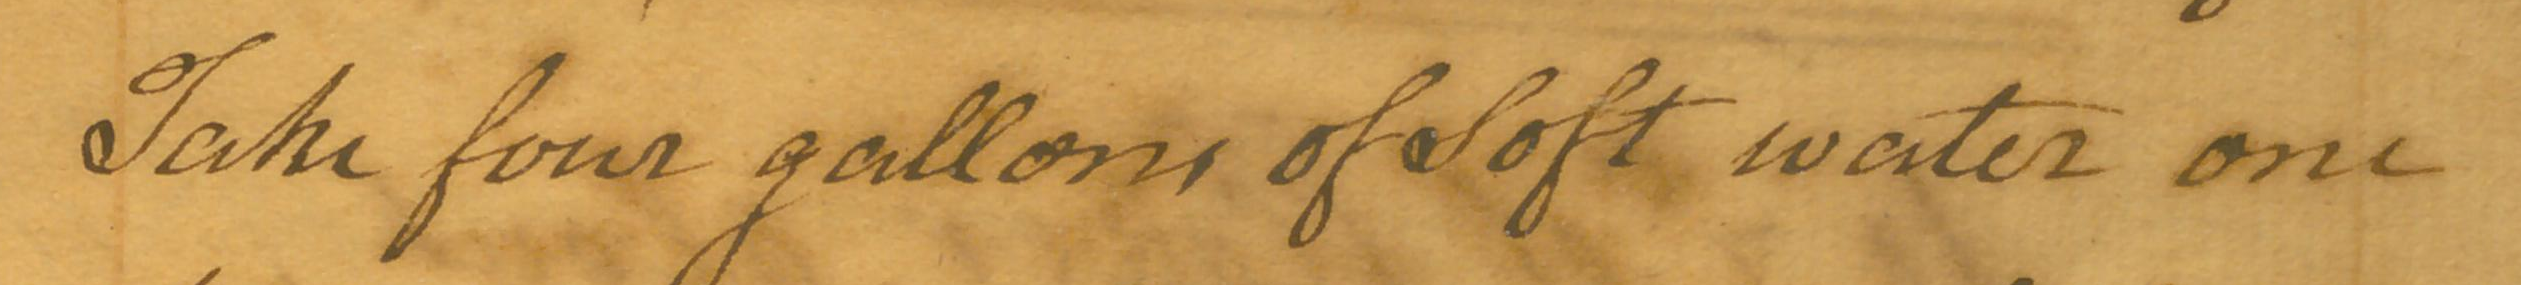Take four gallons of soft water one
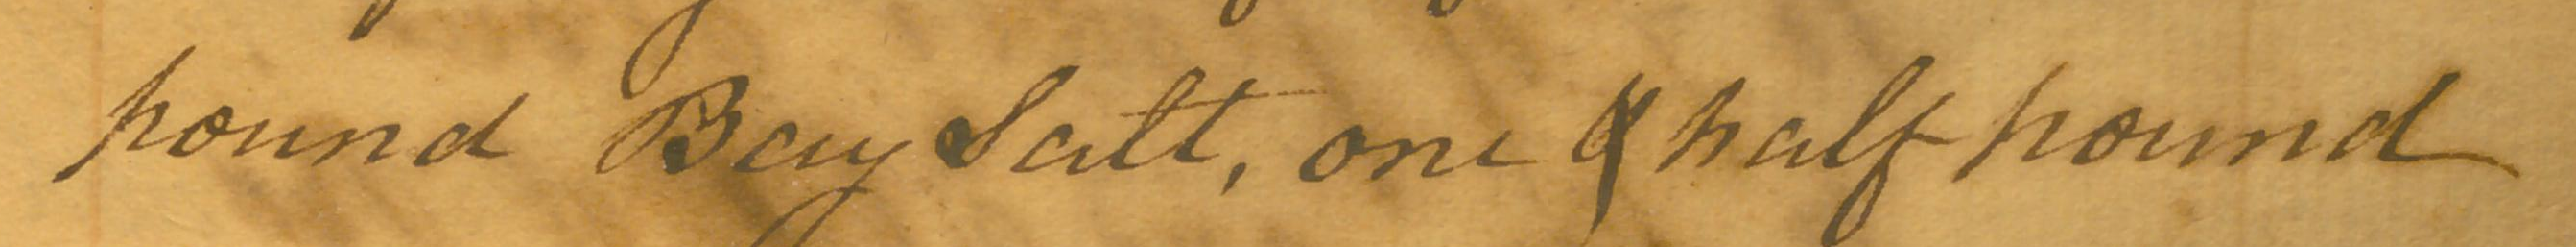pound Bay Salt, one & half pound
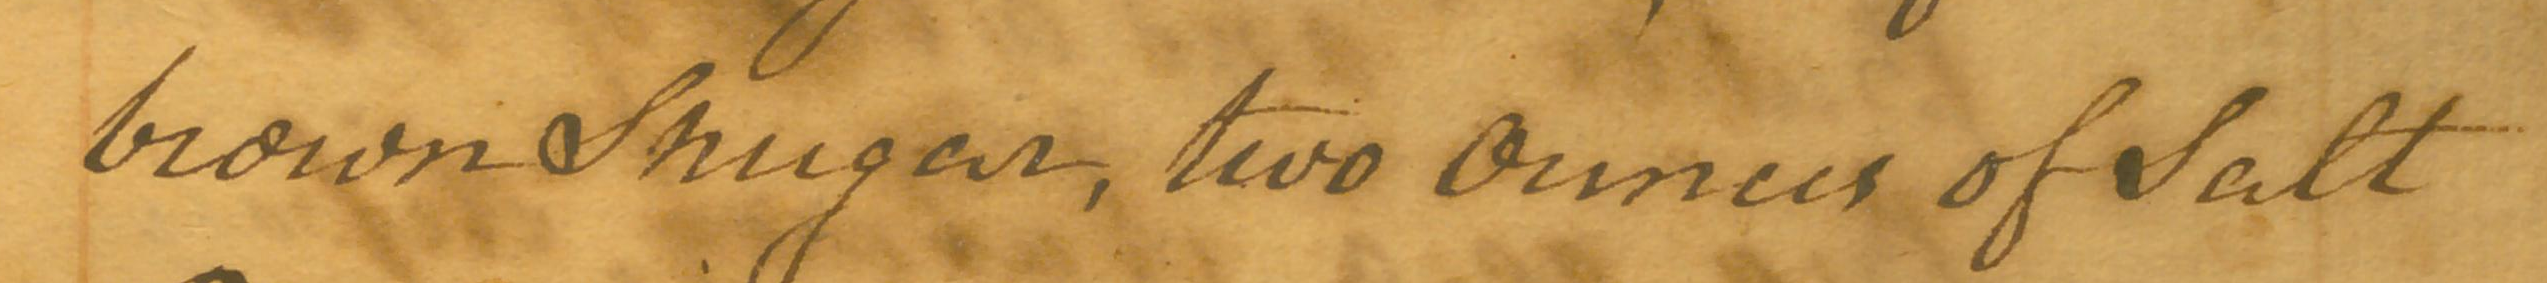brown Shugar, two ounces of Salt
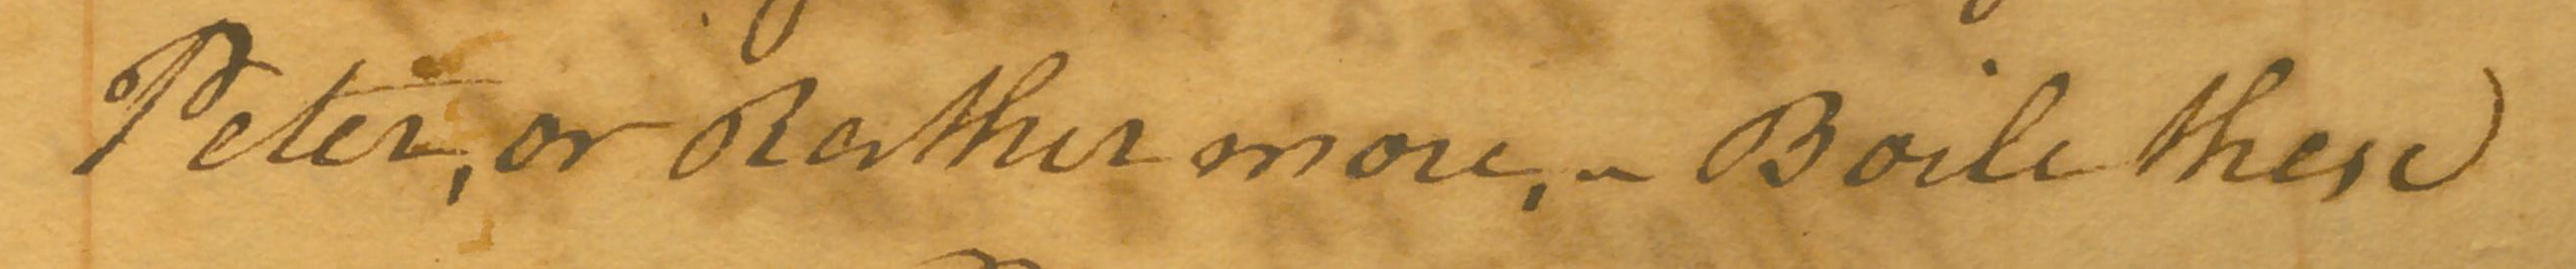Peter, or Rather more,- Boill these
